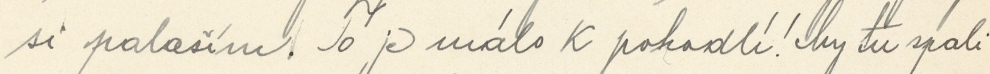si palaším. To je málo k pohodlí! My tu spali
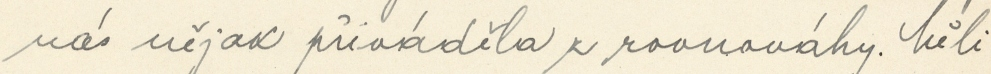nás nějak přiváděla z rovnováhy. Měli
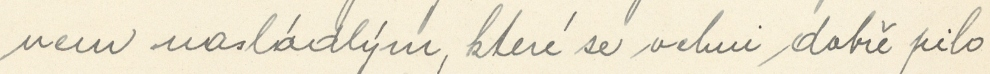nem nasládlým, které se velmi dobře pilo
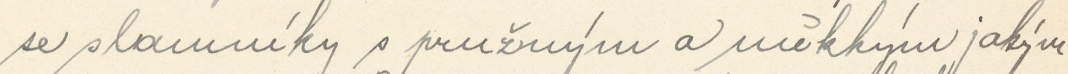se slamníky s pružným a měkkým jakým-
